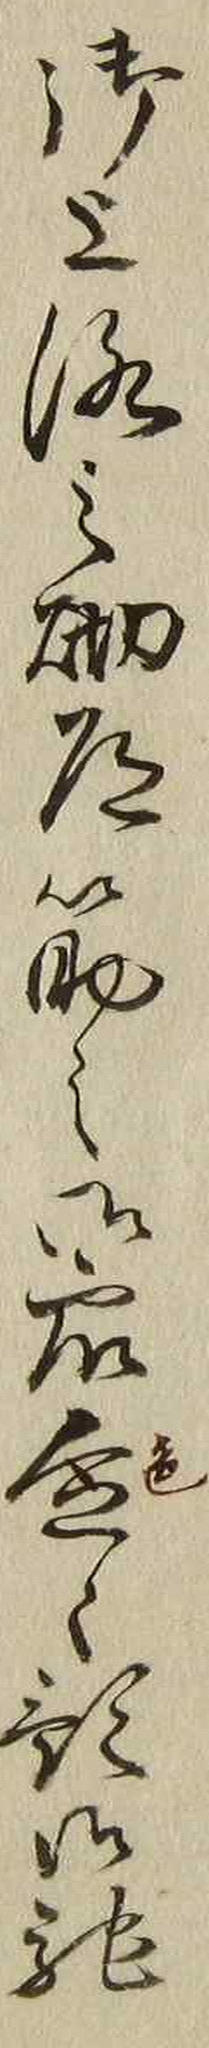御上洛之砌道筋之御衆色々預御馳
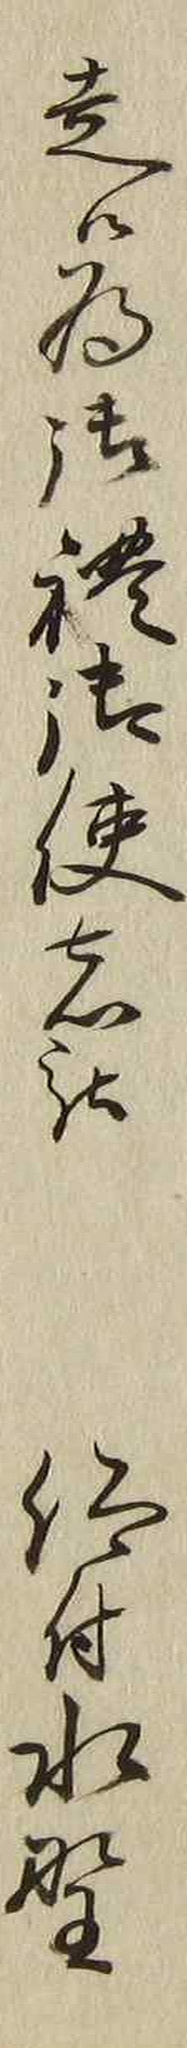走候為御礼御使者被仰付水野
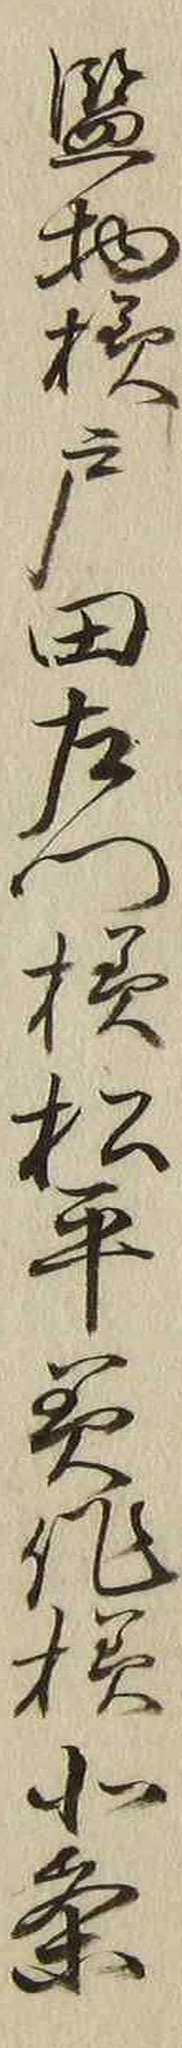監物様戸田左門様松平美作様北条
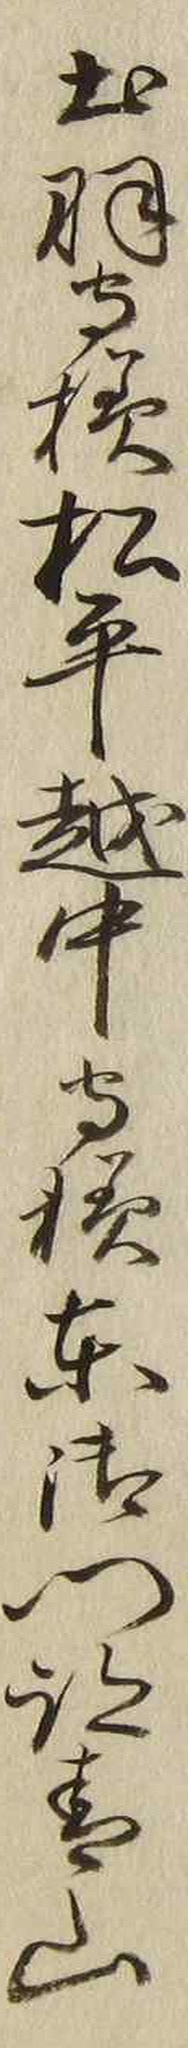出羽守様松平越中守様東御門跡青山
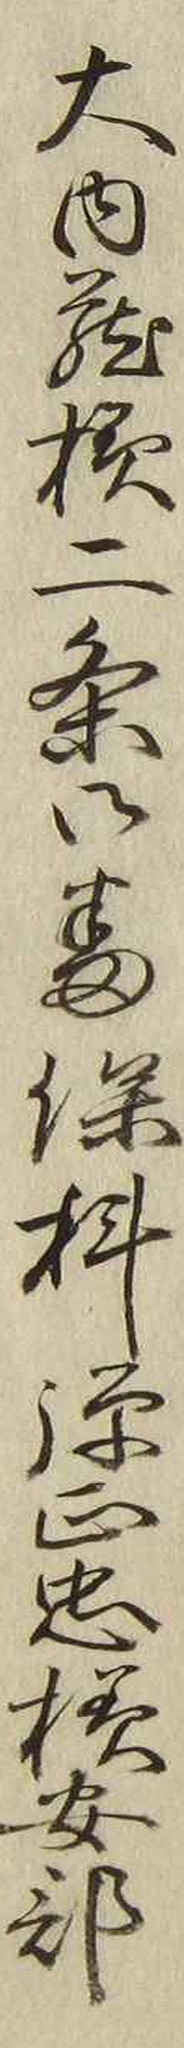大内蔵様二条御番保科弾正忠様安部
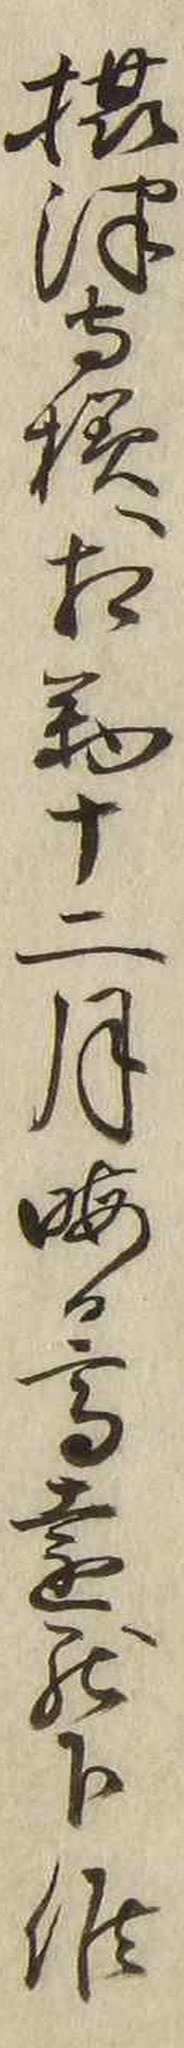摂津守様へ相勤十二月晦日高遠へ罷下候

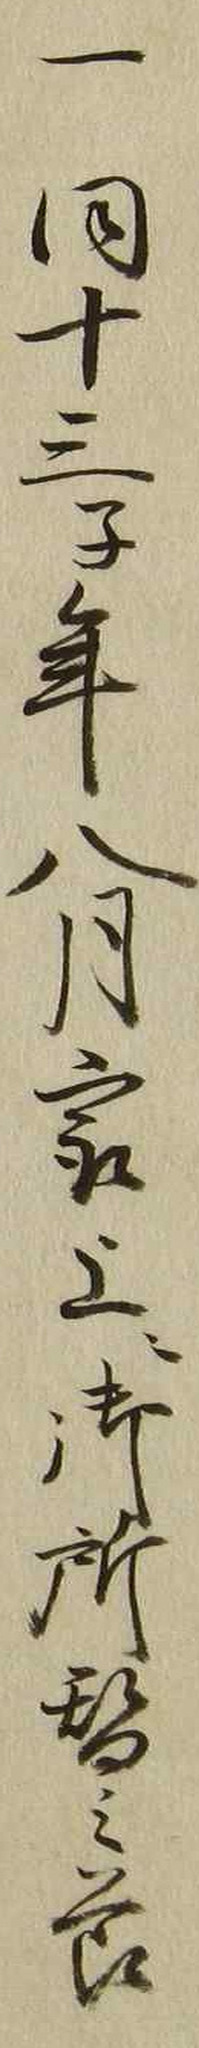一同十三子年八月最上ニ御所替之節
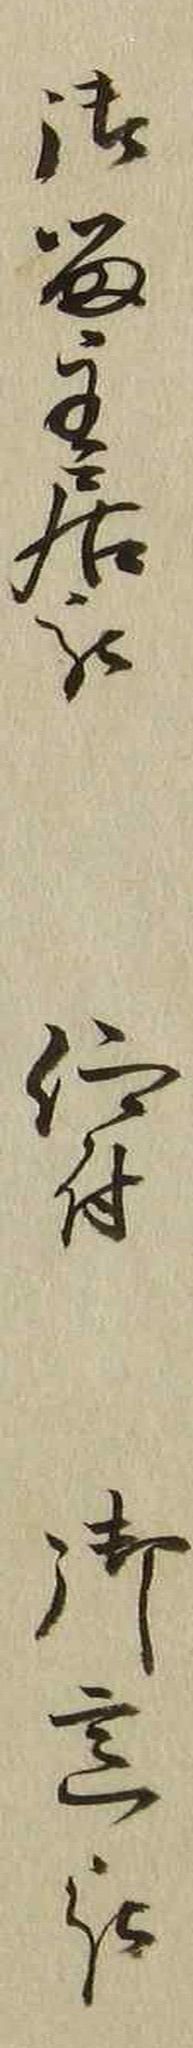御留主居被仰付御意被
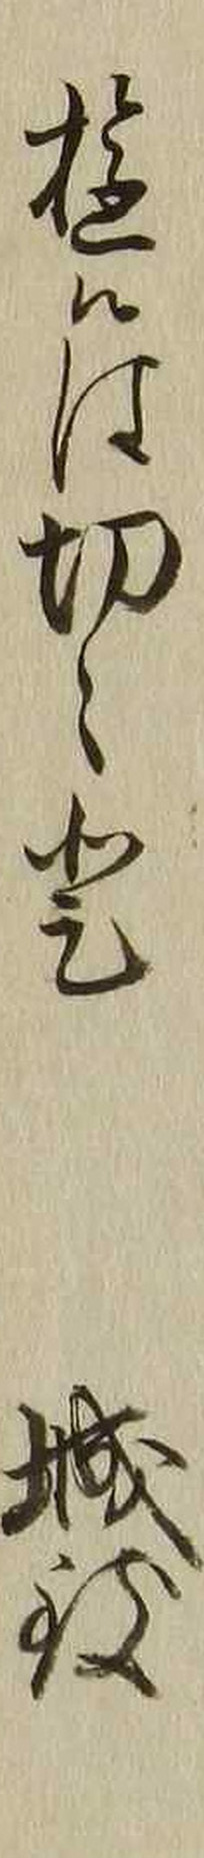遊候は切々登城致
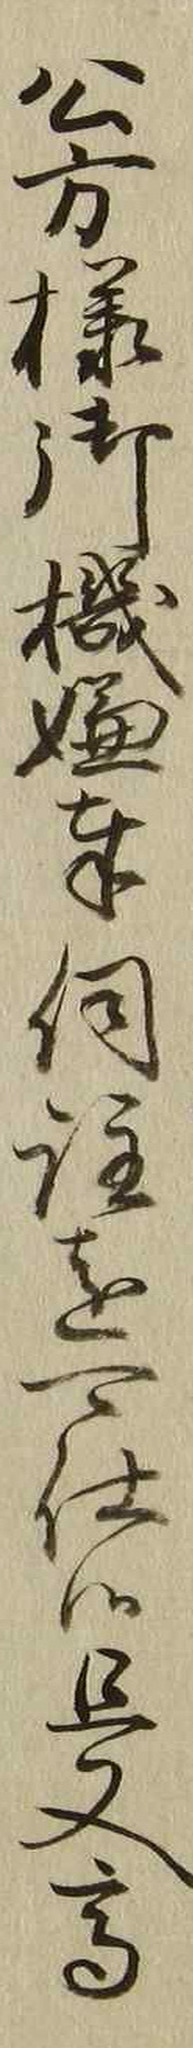公方様御機嫌奉伺注進可仕候且又高
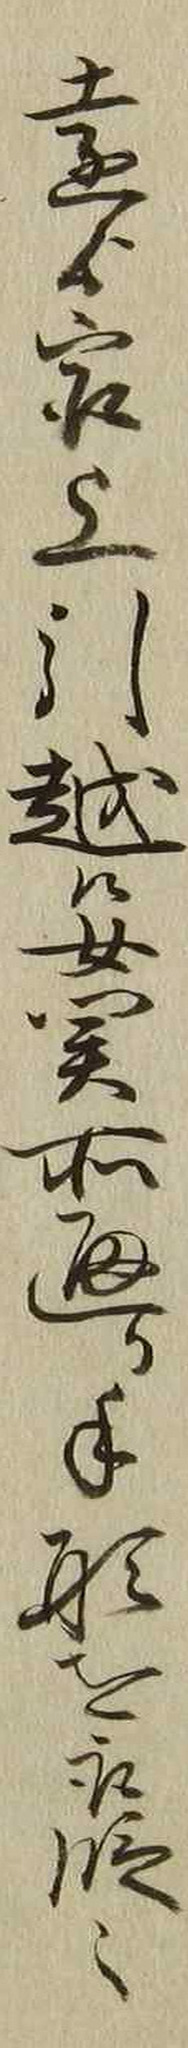遠ゟ最上引越候女関所通り手形を取段々
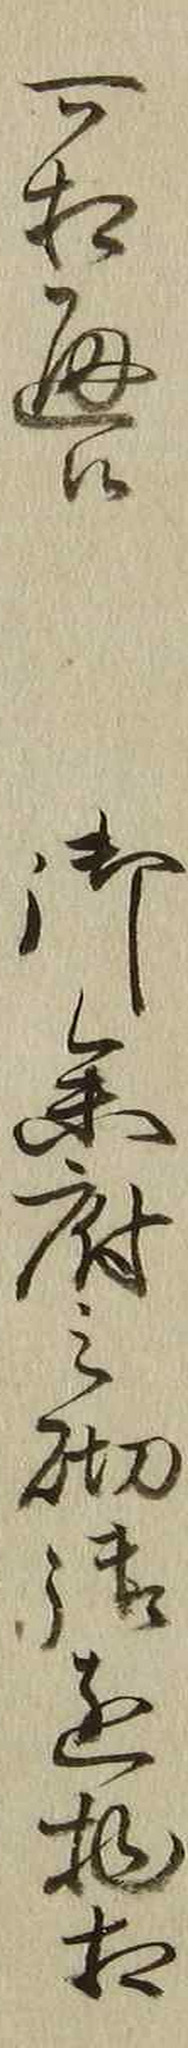可相通候御参府之砌御進物相
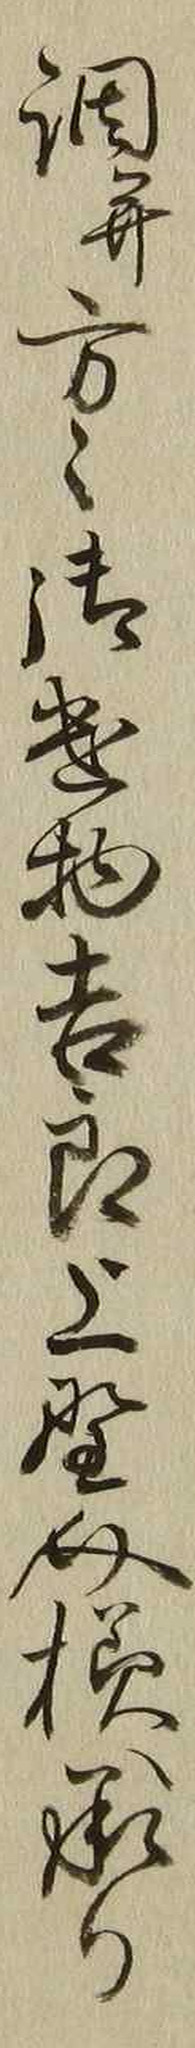調幷方々御遣物吉良上野介様へ承り
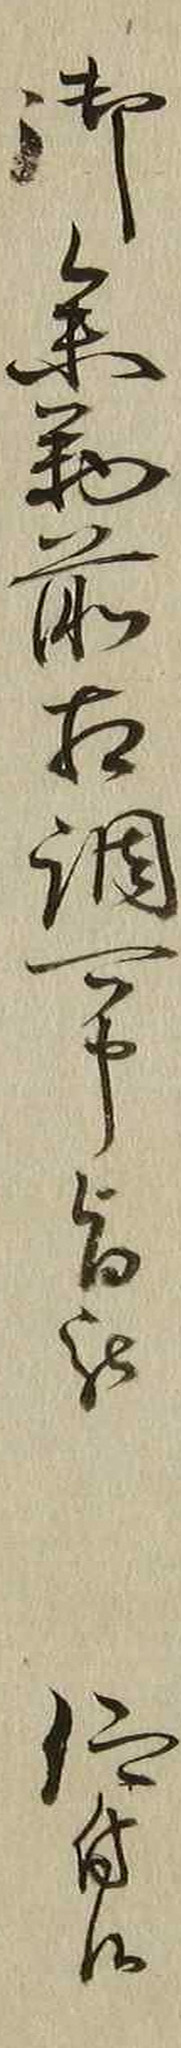御参勤前相調可申旨被仰付候
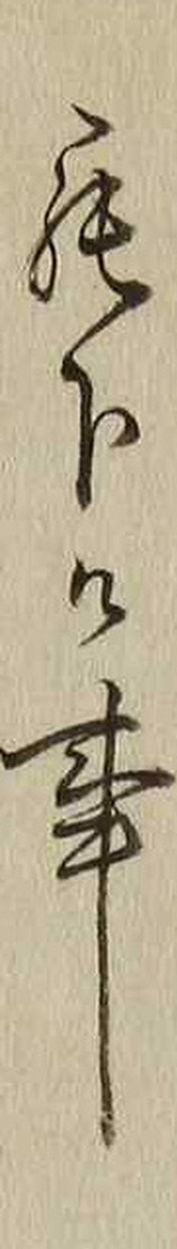罷下候事
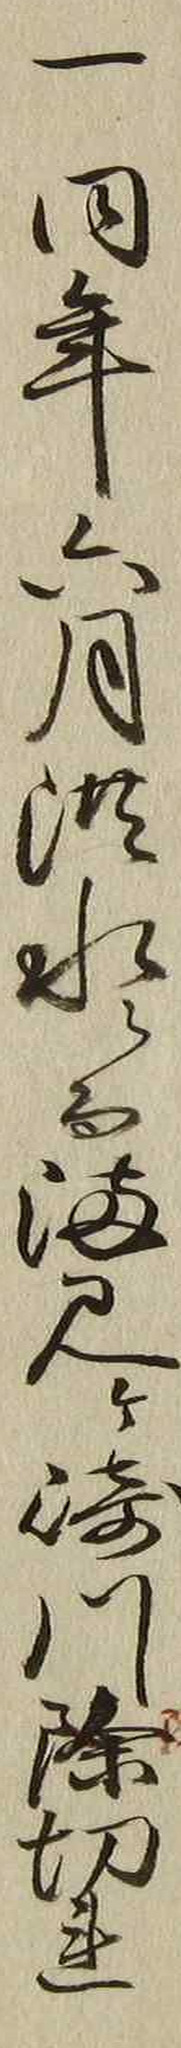一同年六月洪水ニ而満見ヶ崎川除切れ
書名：諸士系譜　巻之60　と之部3
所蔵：会津若松市立会津図書館
